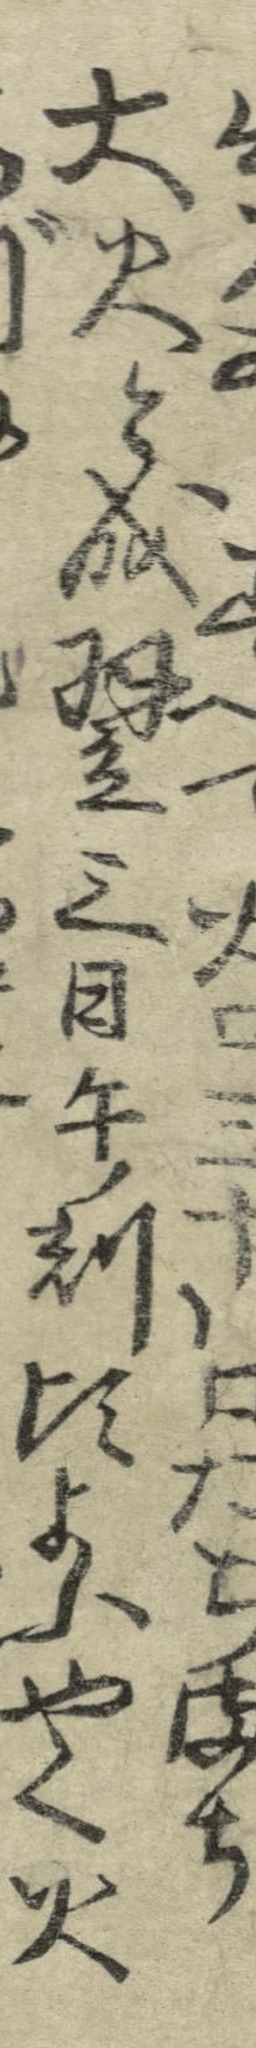大火と成翌三日午ノ刻頃よふやく火
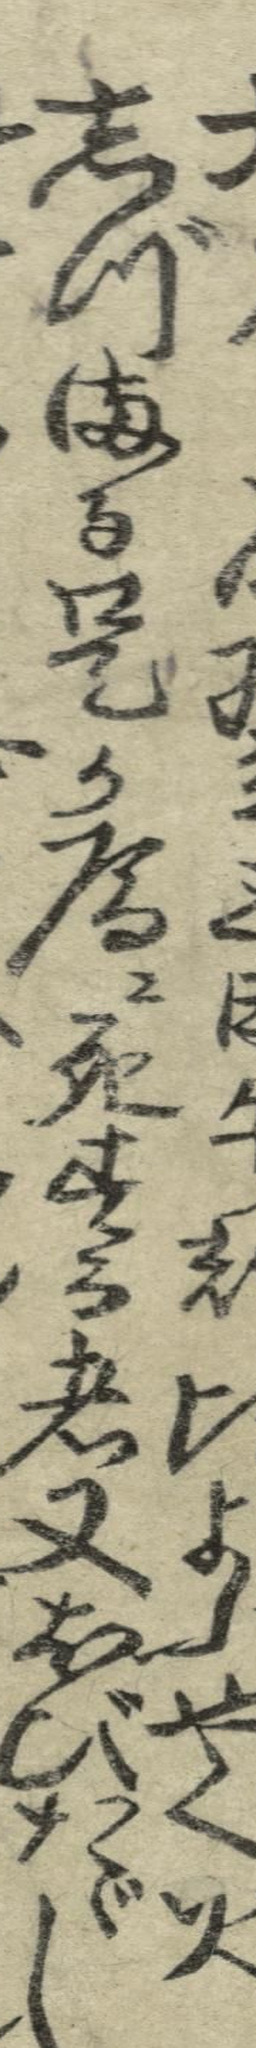しづまる是か為ニ死する者又おびたゞし
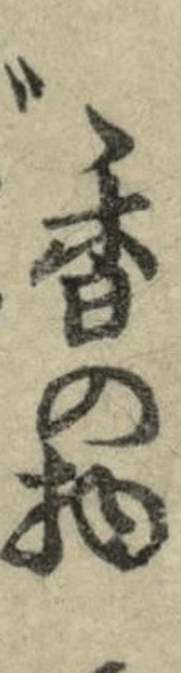香の物
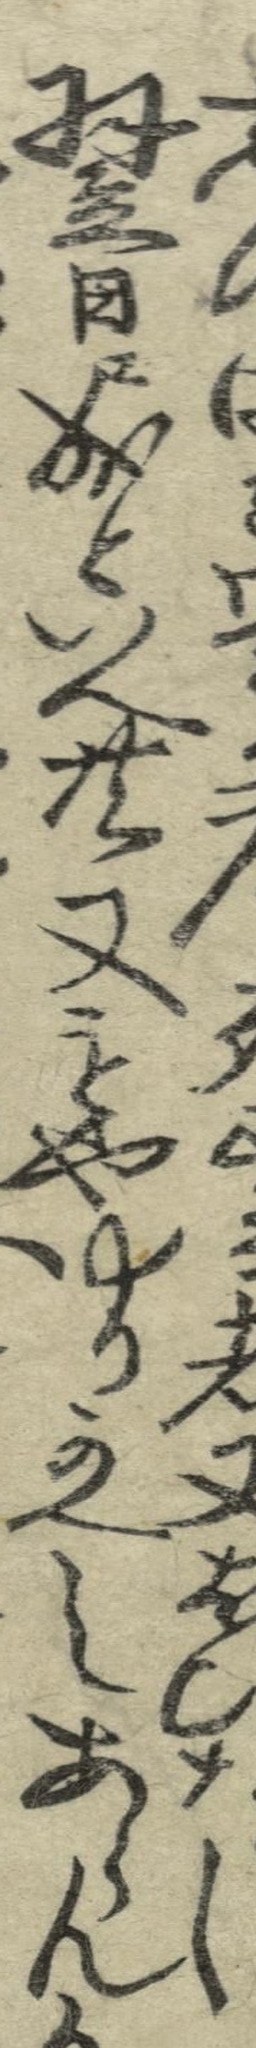翌日ニ成といへ共又もやゆりかへしあらんかと
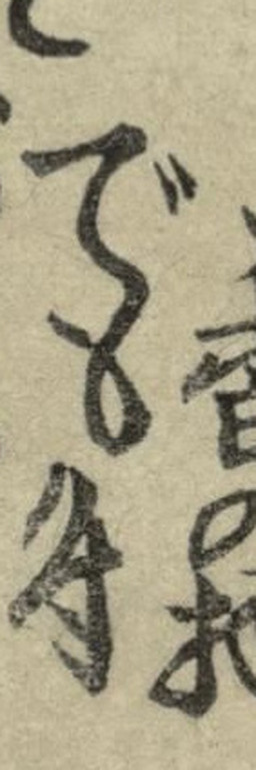でも付
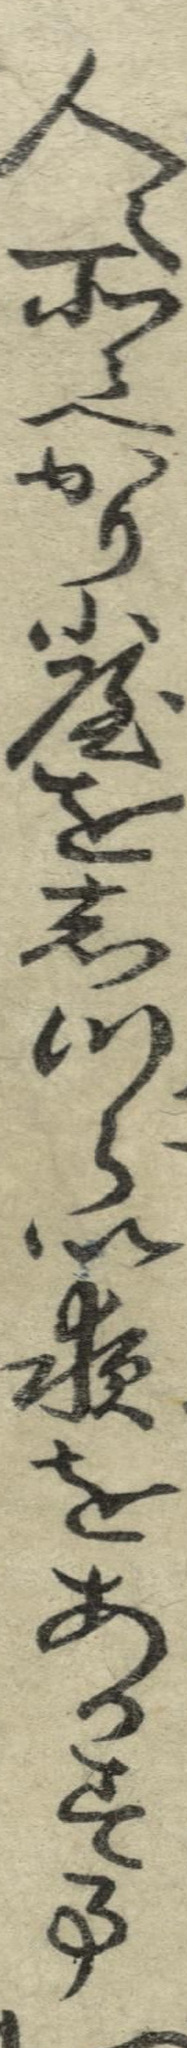人々所々へかり小屋をしつらい夜をあかす事
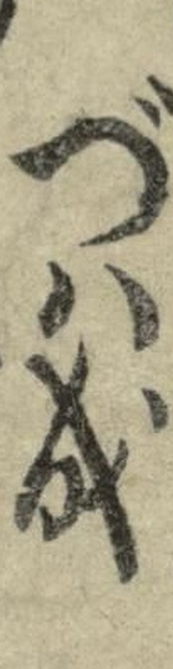づは成
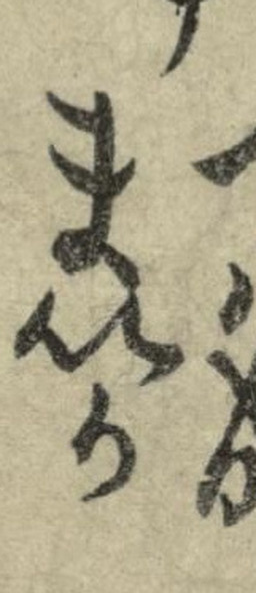まいか
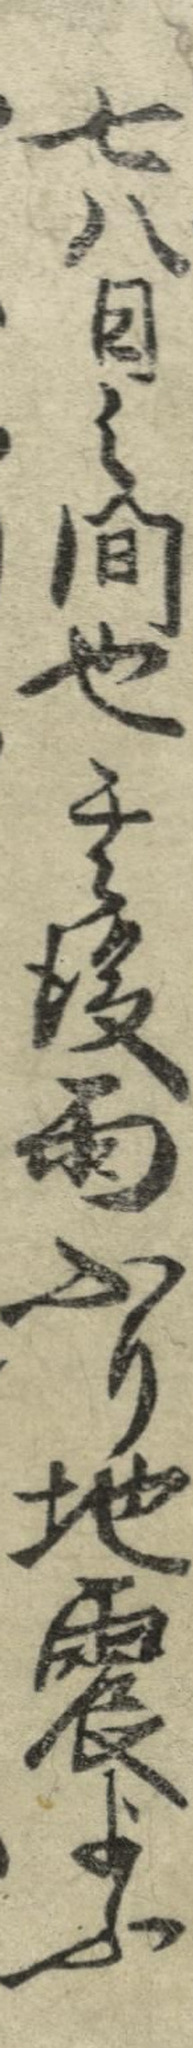七八日之間也其後雨ふり地震よふ
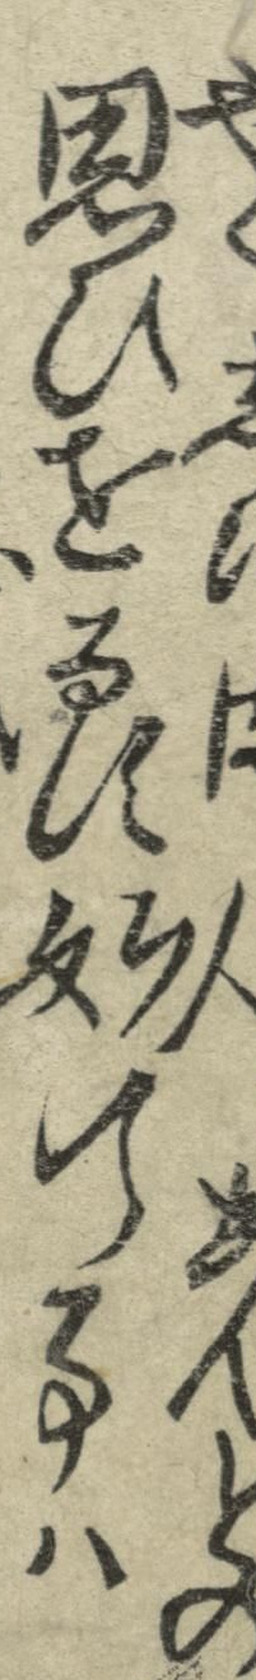思ひをなす始てノ事は
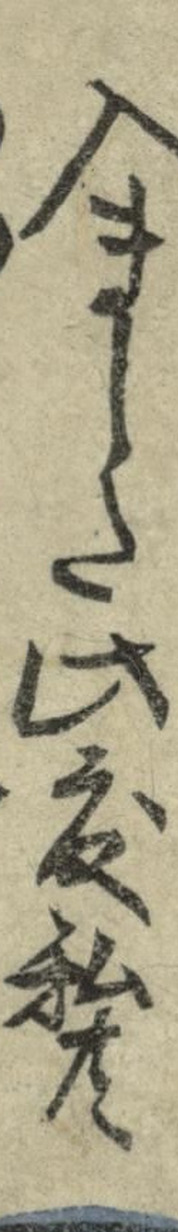入ました此度私共
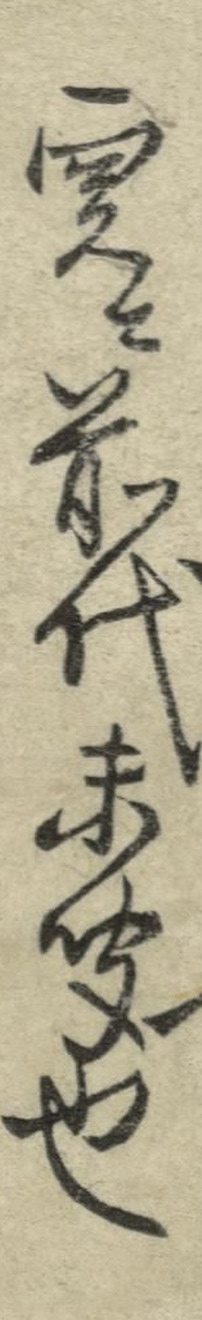実ニ前代未聞也
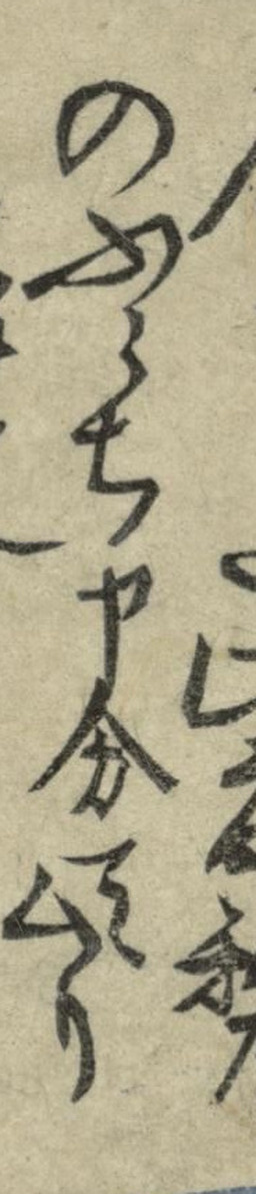のふらち申分は厶り
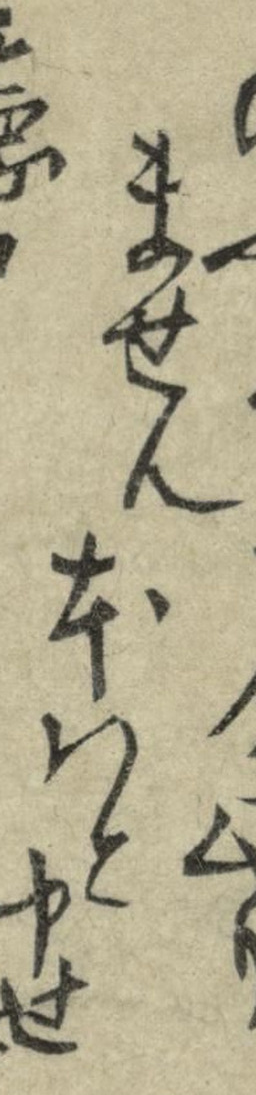ません本はと申せば
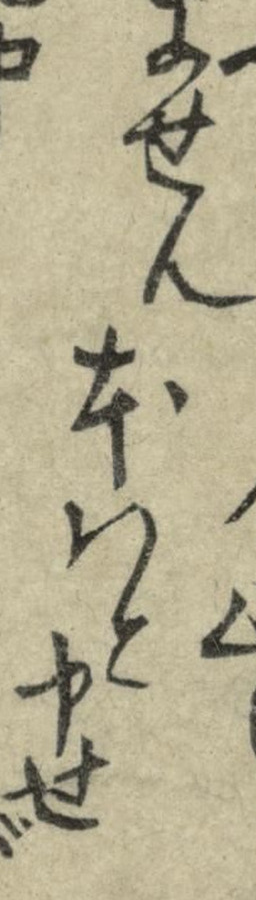ません本はと申せば
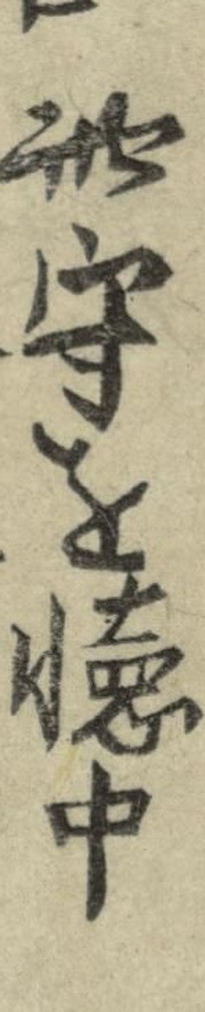此守を懐中
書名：太平安心之為
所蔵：東京大学地震研究所図書室 Earthquake Research Institute Library, The University of Tokyo, JAPAN
